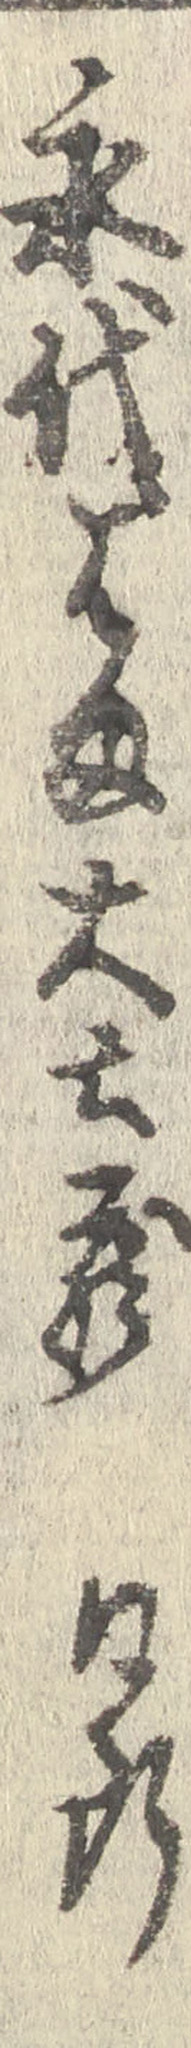永代はま大土蔵同断
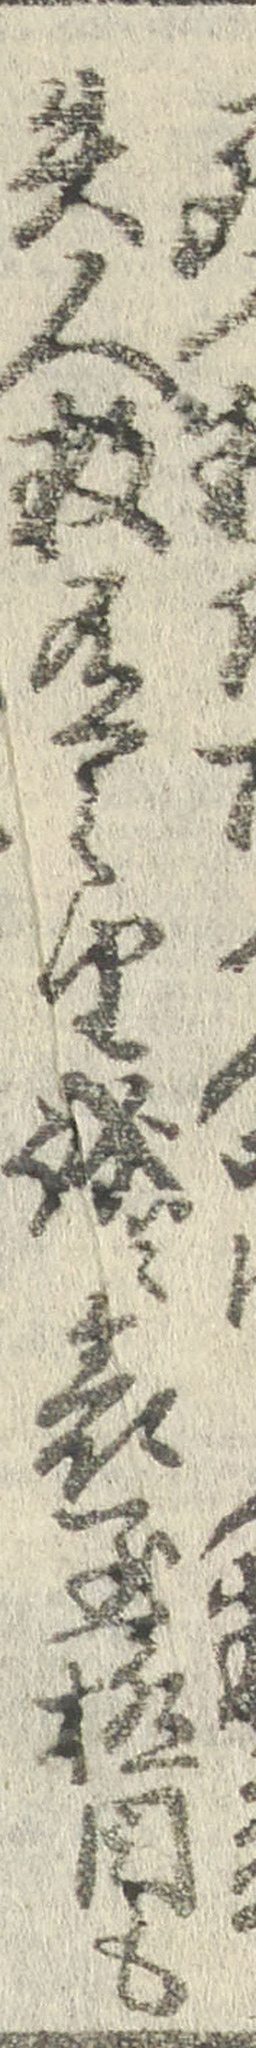失人数有之由誠に哀至極目も
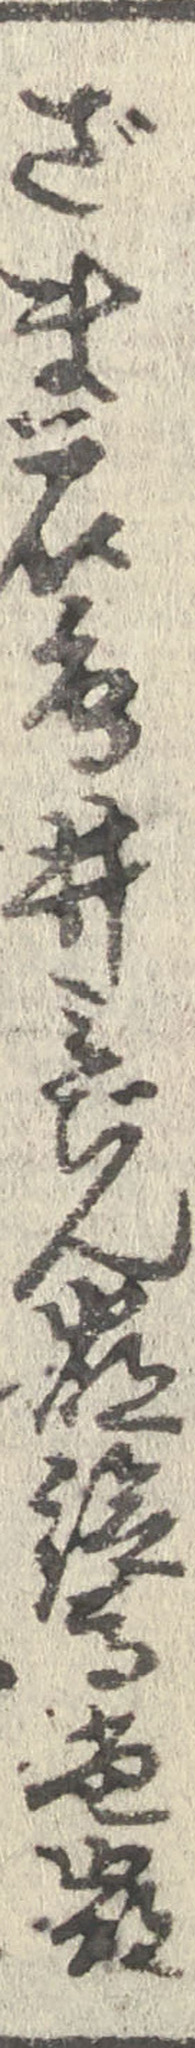ざま石鳥井みぢん崩絵馬堂崩
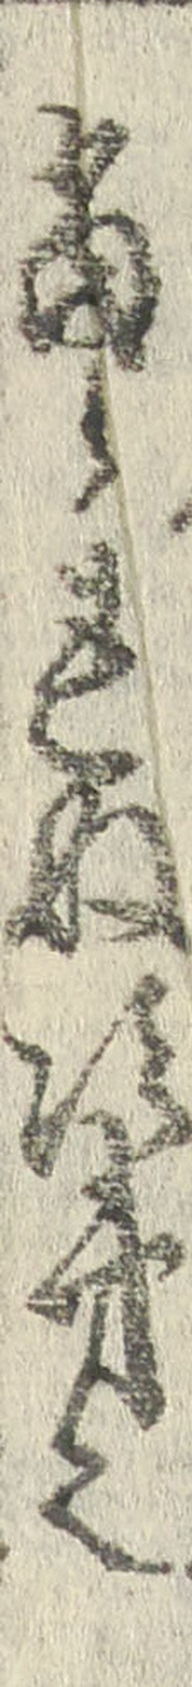当られぬ次第也
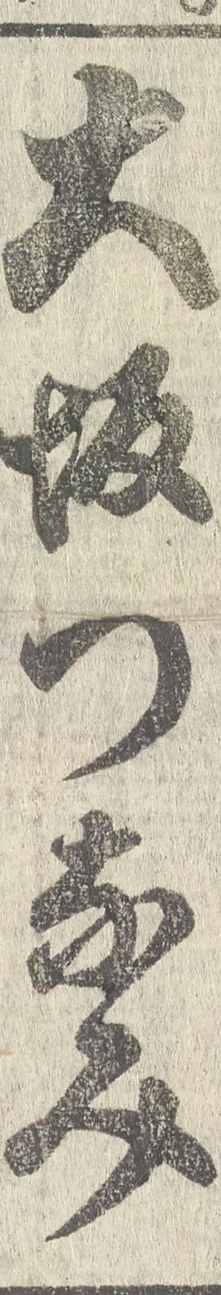大坂つなみ
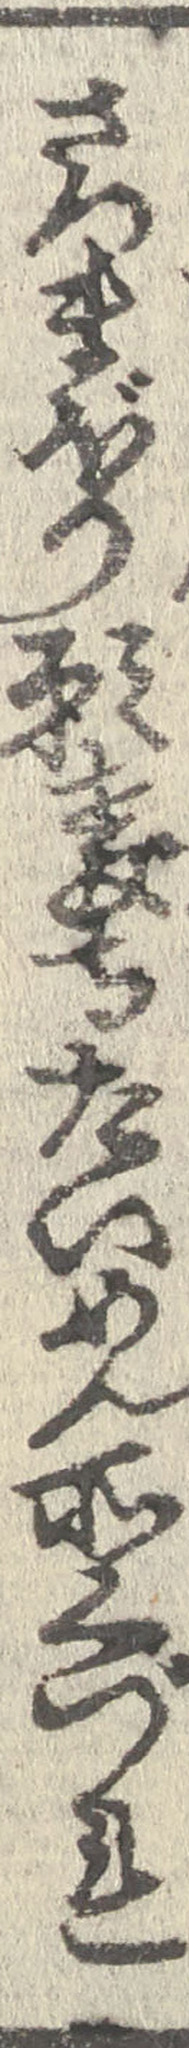さつまぼり願教寺たいめん所くづれ
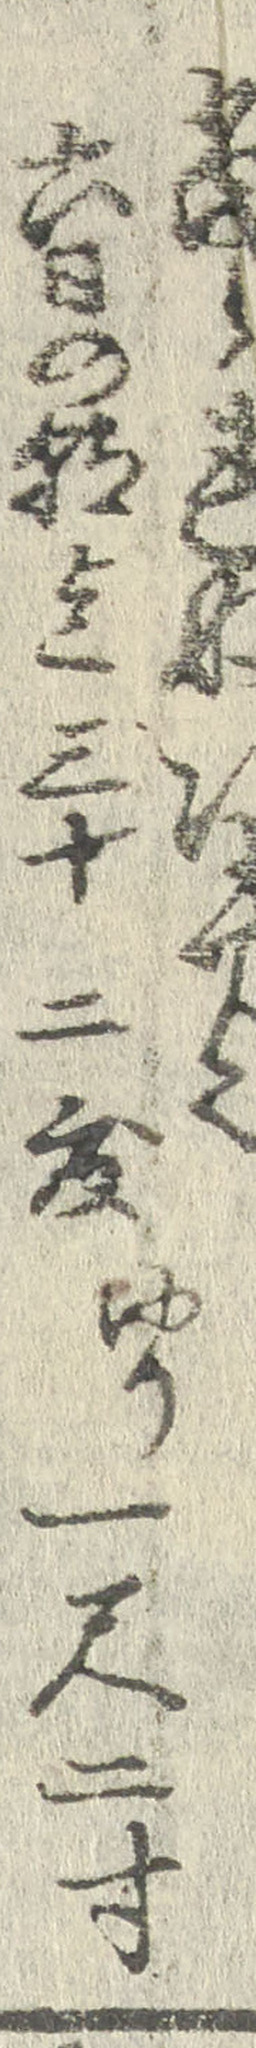六日の朝まで三十二度ゆり一尺二寸
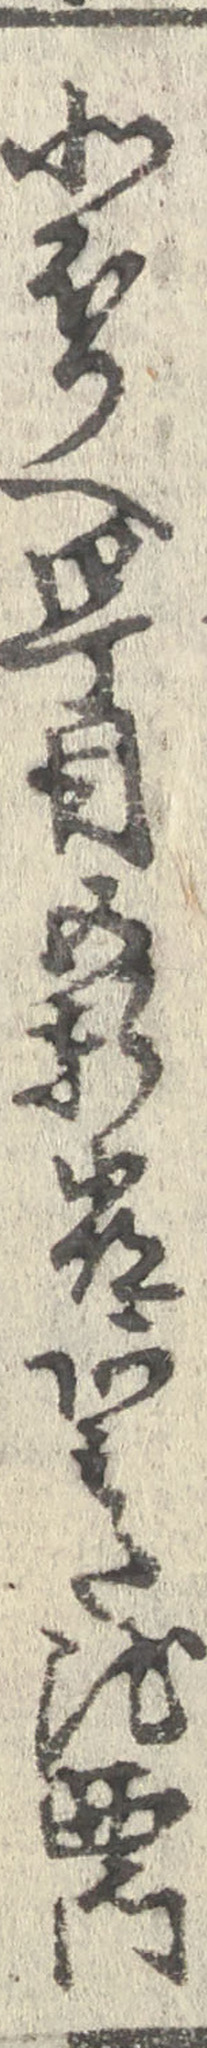北ほりへ四丁目五軒崩あみた池西門
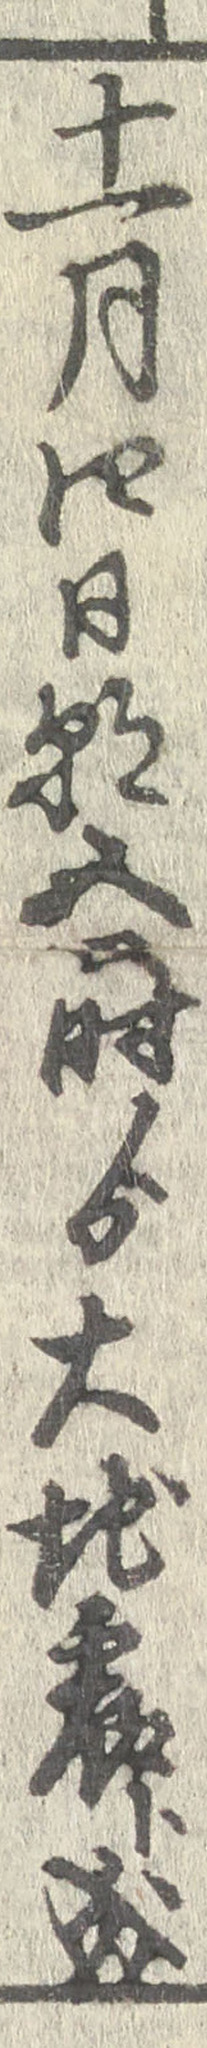十一月四日朝五ツ時ゟ大地震と成
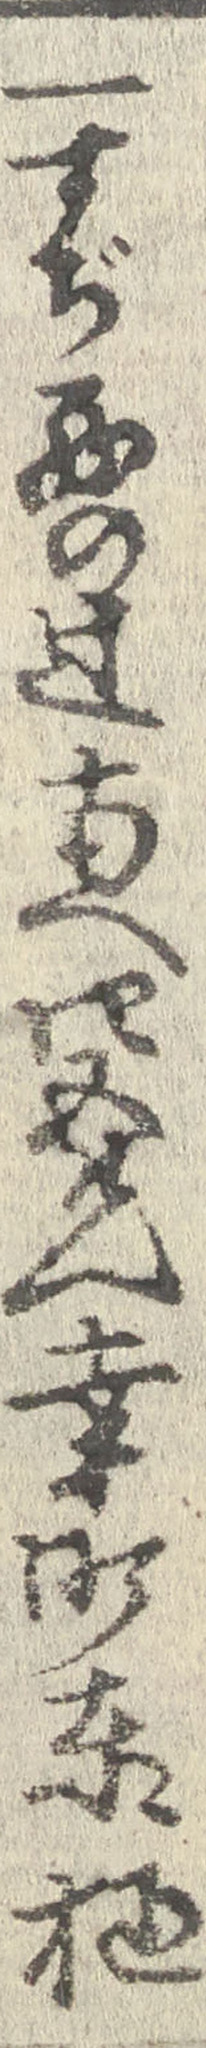一すじ西の辻南へ四五けん幸町東樋
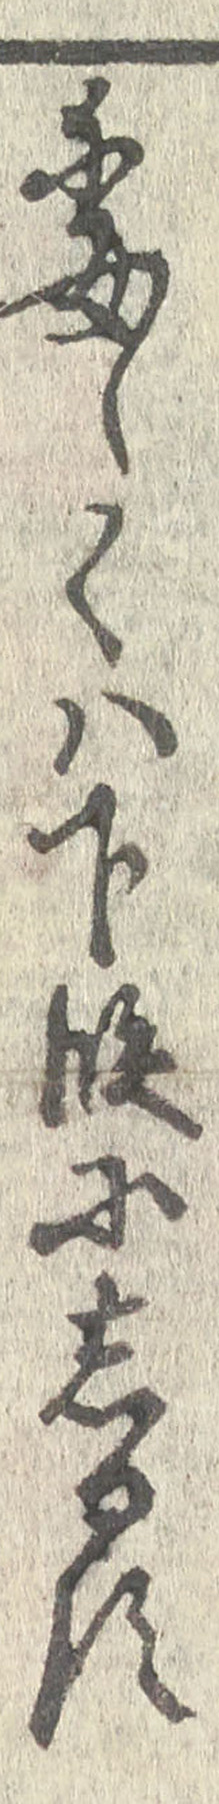委しくは下段にしるす
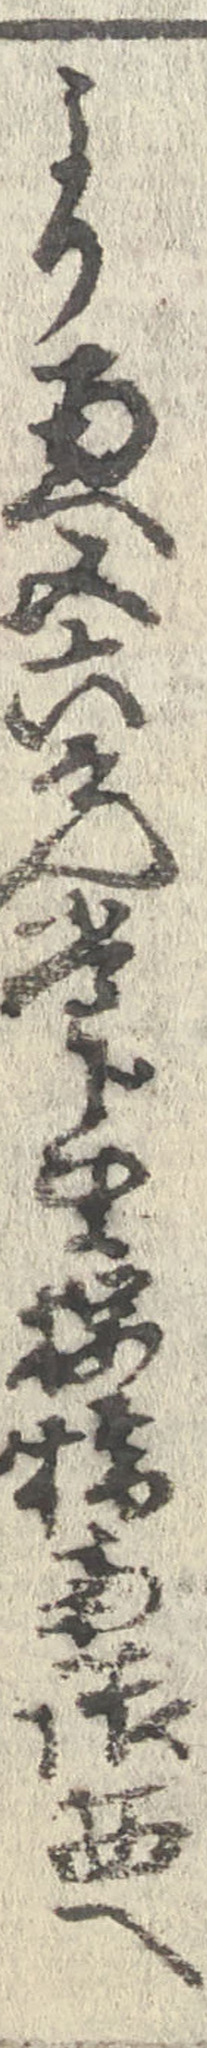より南へ五六けん堂じま桜橋南詰西へ
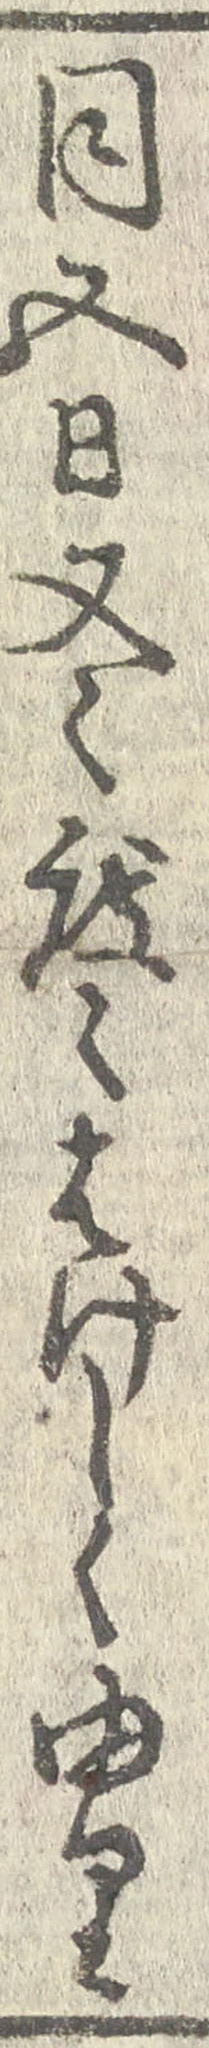同五日又々度々はけしくゆり
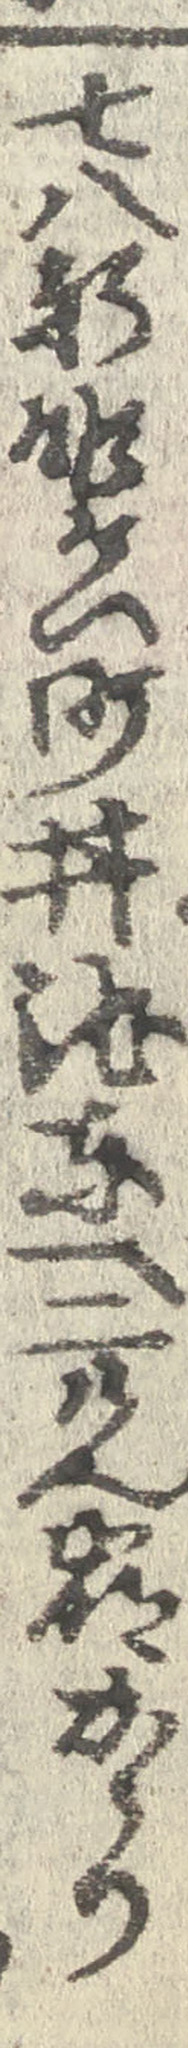七八軒順けい町丼池東へ二けん崩かゝり
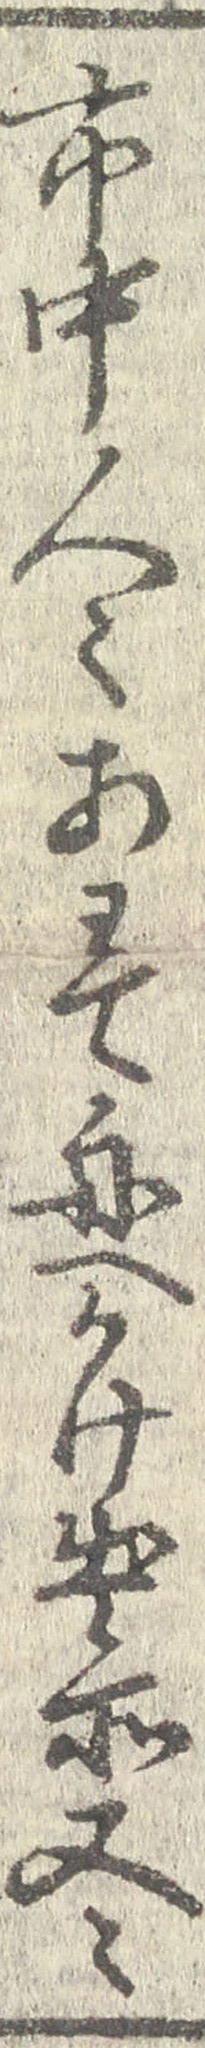市中人々あわて舟へかけ出候所又々
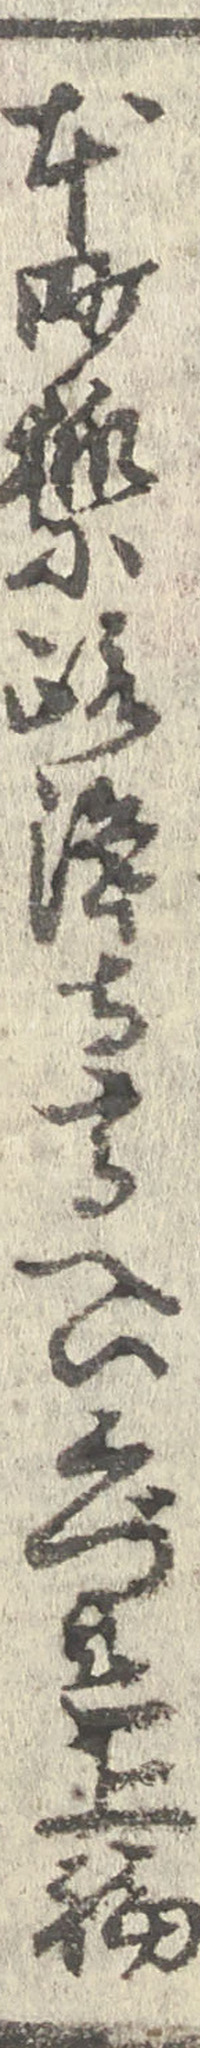本町狐小路浄土寺高へいくづれ上福
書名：聞書諸国并大阪大地震つなみ
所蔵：東京大学総合図書館 General Library in the University of Tokyo, JAPAN
